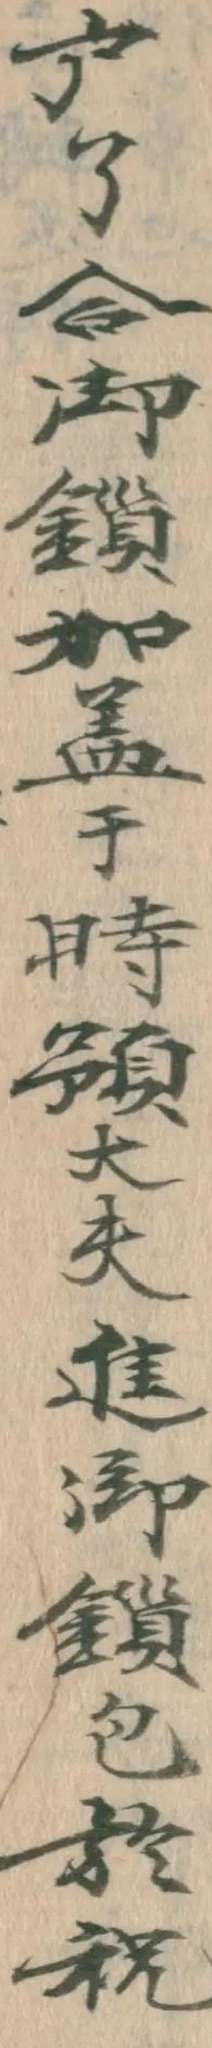戸了合御鎖加盖于時預大夫進御鎖包於祝
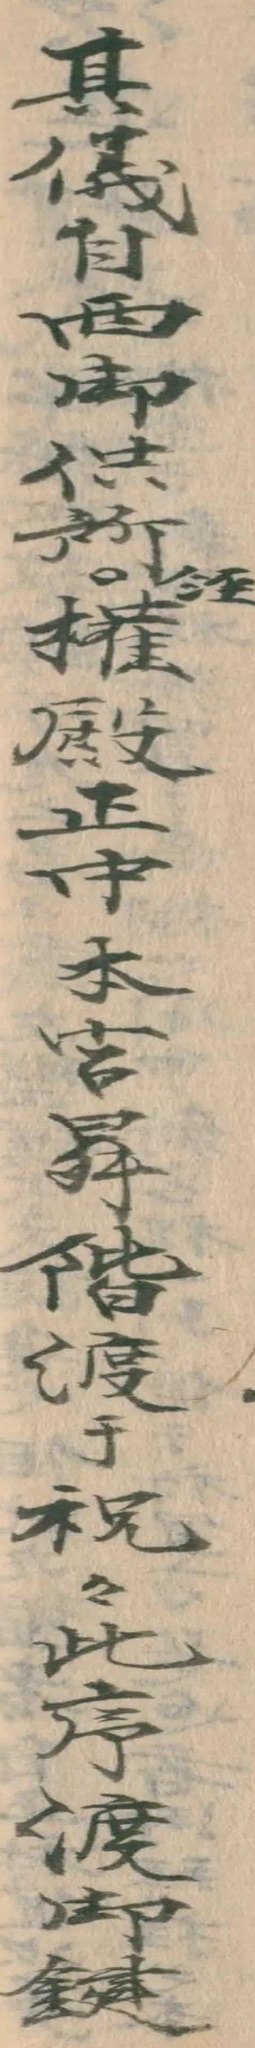其儀自西御供所◦権殿正中本宮昇階渡于祝々此序渡御鍵
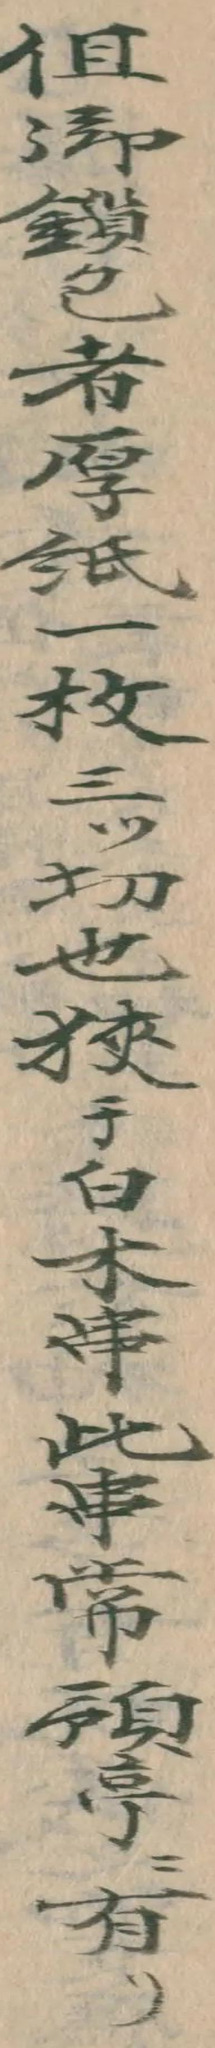但御鎖包者厚紙一枚三ツ切也狭于白木串此串常預亭ニ有リ
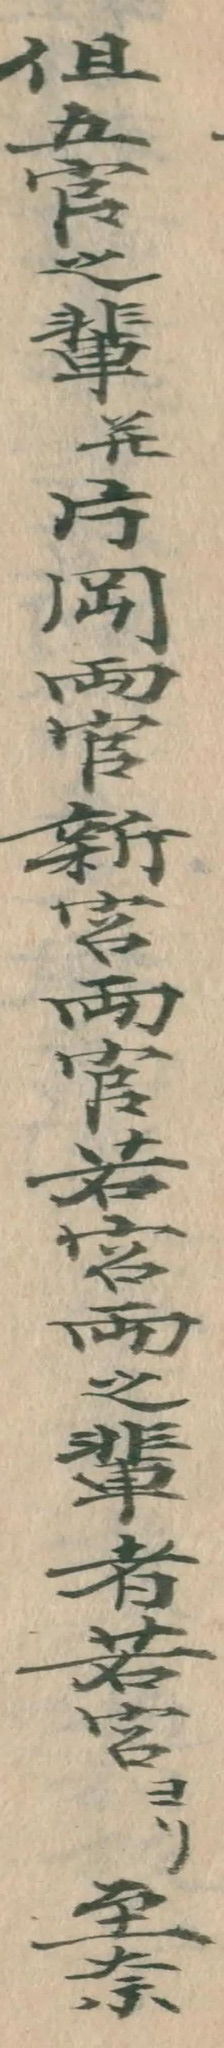但五官之輩并片岡両官新宮両官若宮両之輩者若宮ヨリ至奈
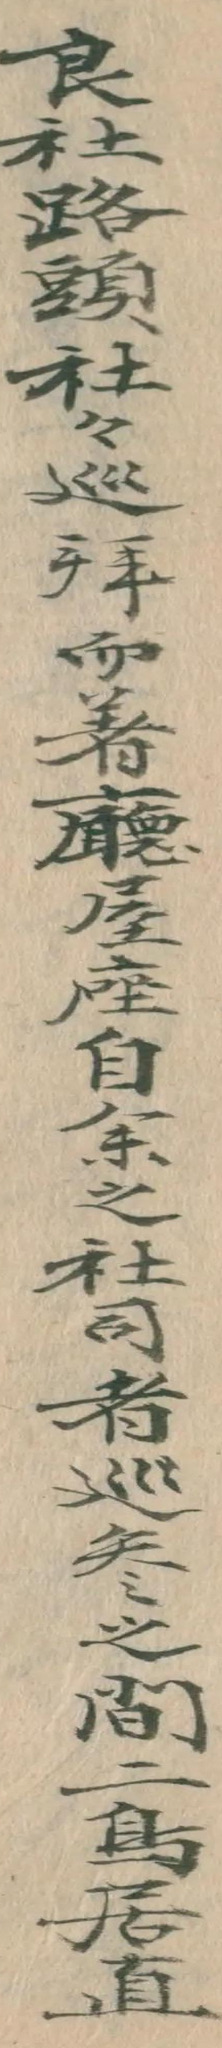良社路頭社々巡拝而着庁屋座自余之社司者巡参之間二鳥居直
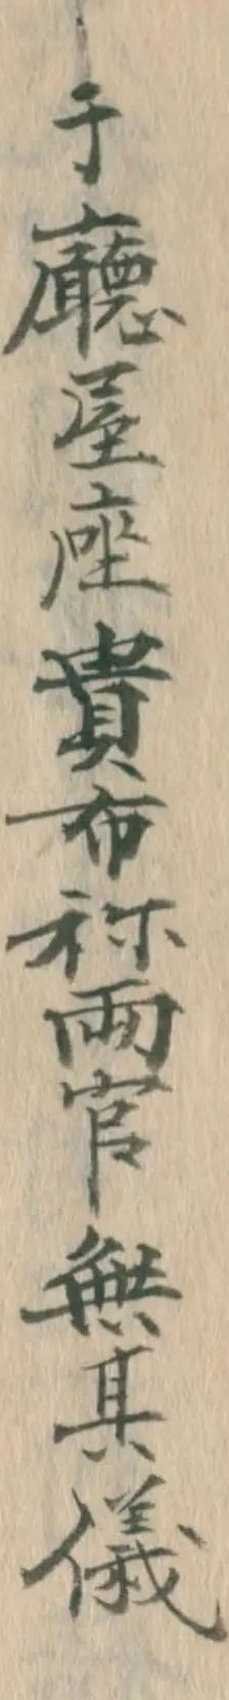于庁屋座貴ふね両官無其儀
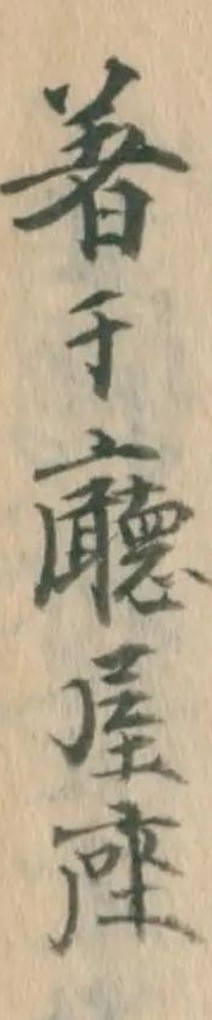着于庁屋座

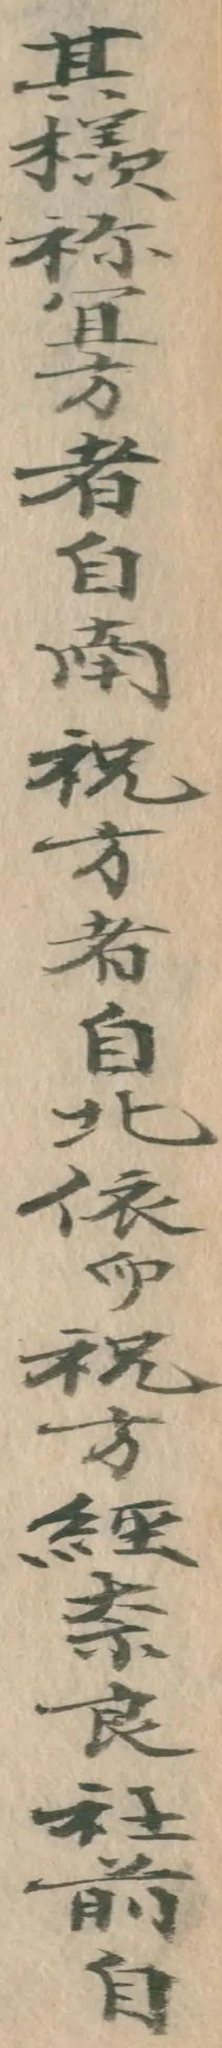其様祢宜方者自南祝方者自北依而祝方経奈良社前自
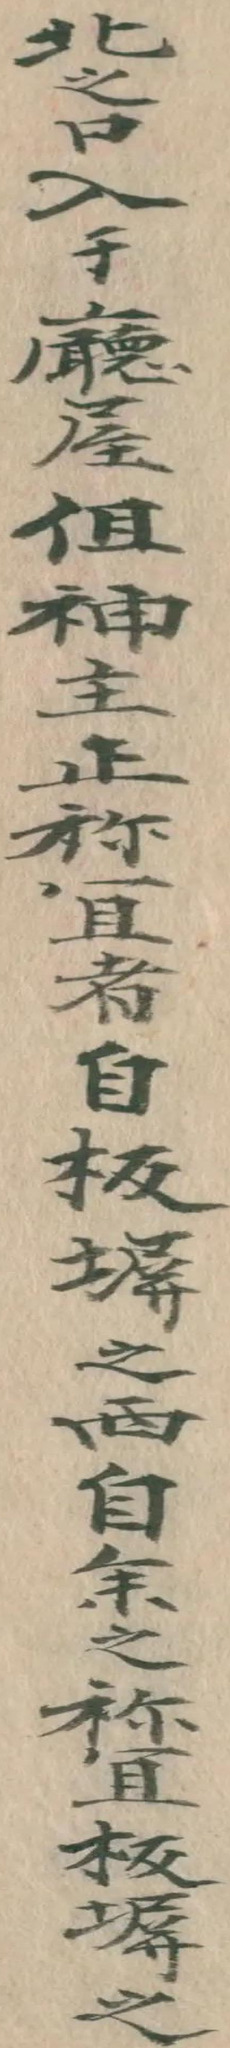北之口入于庁屋但神主正祢宜者自板塀之西自余之祢宜板塀之
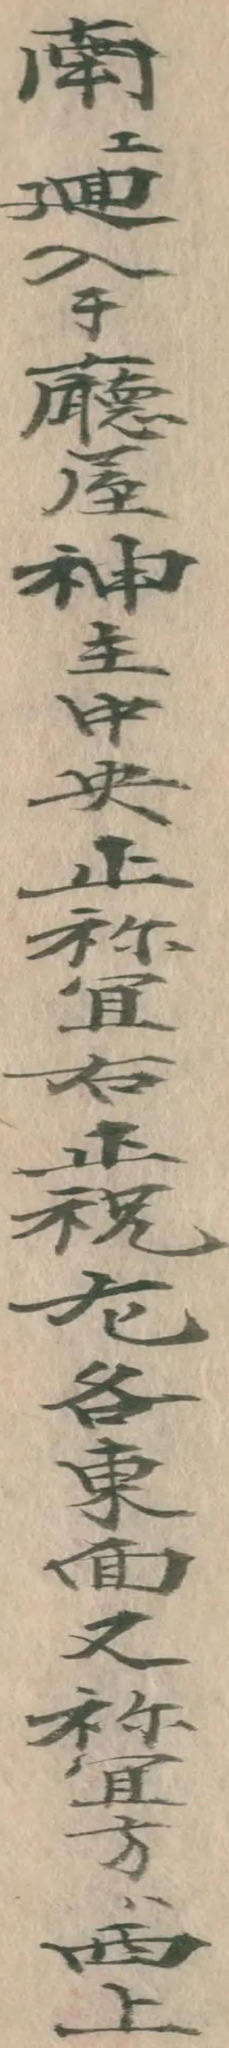南エ廻入于庁屋神主中央正祢宜右正祝左各東面又祢宜方ハ西上
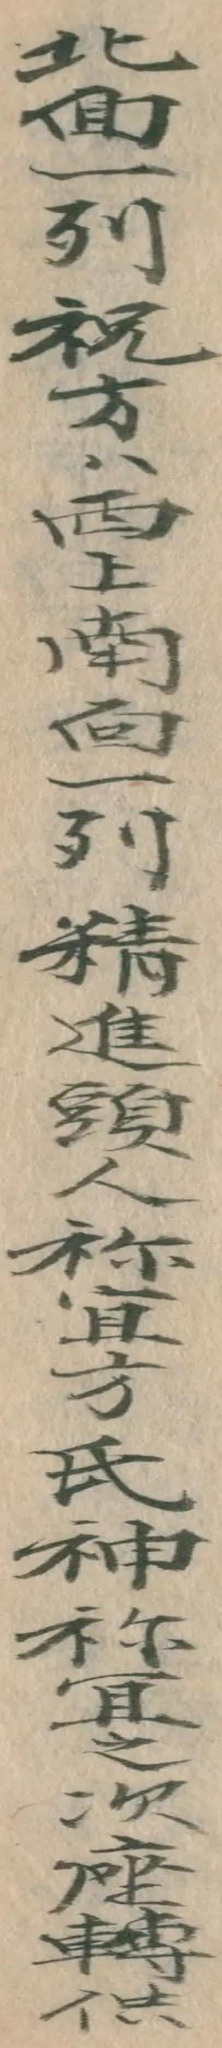北面一列祝方ハ西上南向一列精進頭人祢宜方氏神祢宜之次座転供
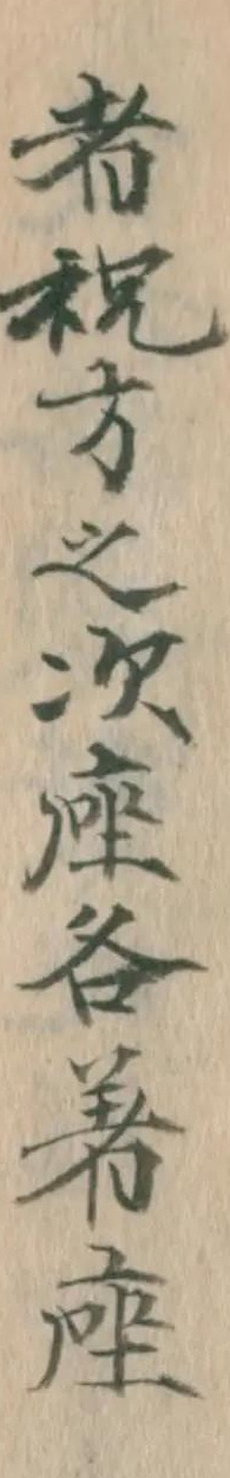者祝方之次座各着座
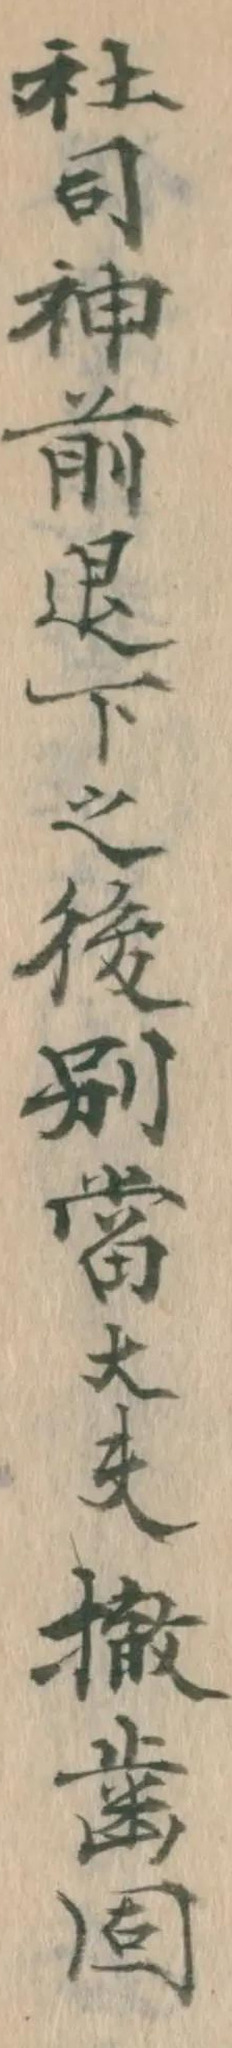社司神前退下之後別当大夫撤歯固
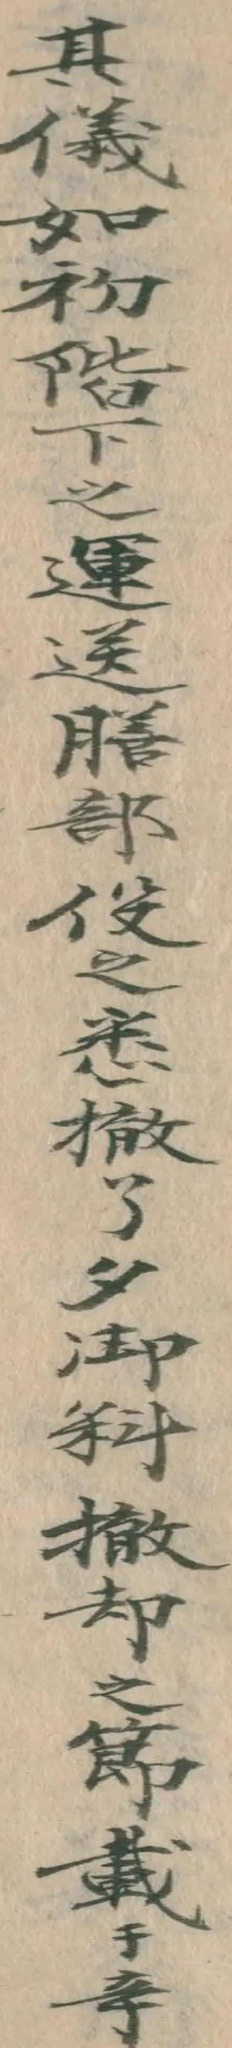其儀如初階下之運送膳部役之悉撤了夕御料撤却之節載于辛
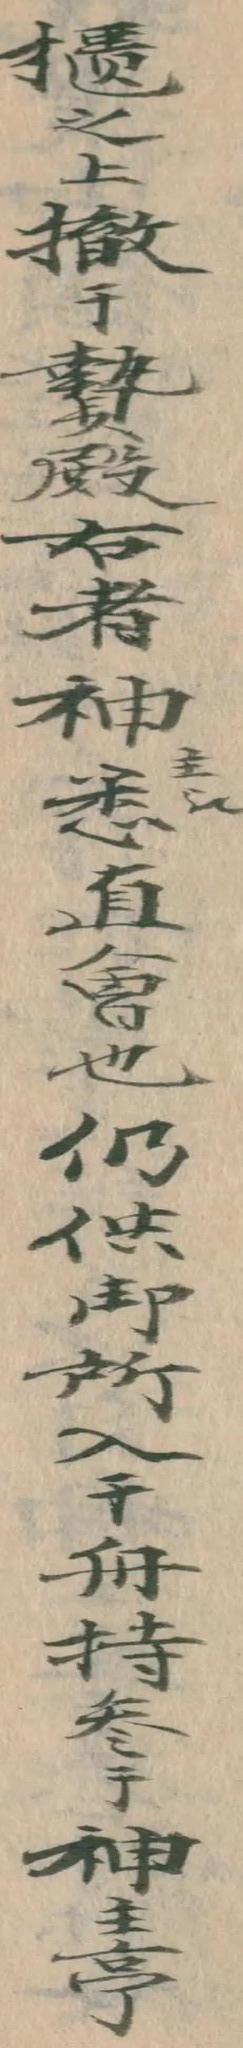櫃之上撤于贄殿右者神悉直会也仍供御所入于舟持参于神主亭
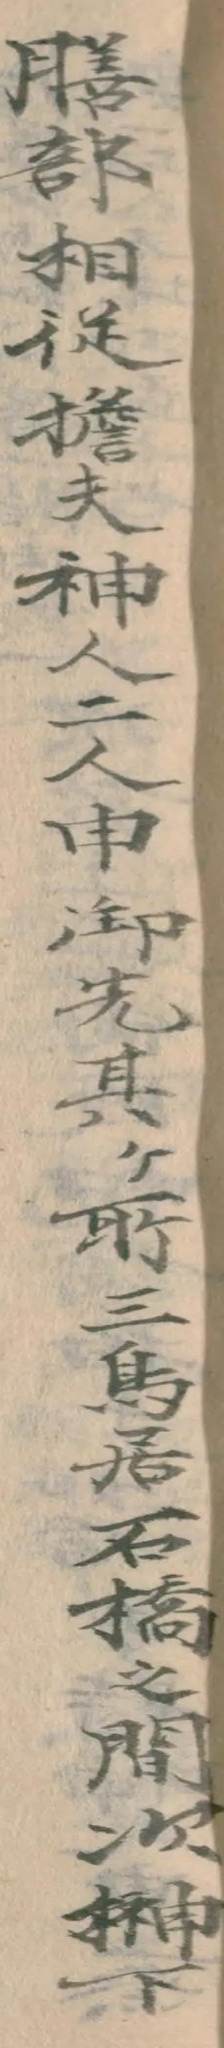膳部相従担夫神人二人申御先其ケ所三鳥居石橋之間次榊下
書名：賀茂社記録. 第9冊
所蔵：国立国会図書館 National Diet Library, JAPAN
